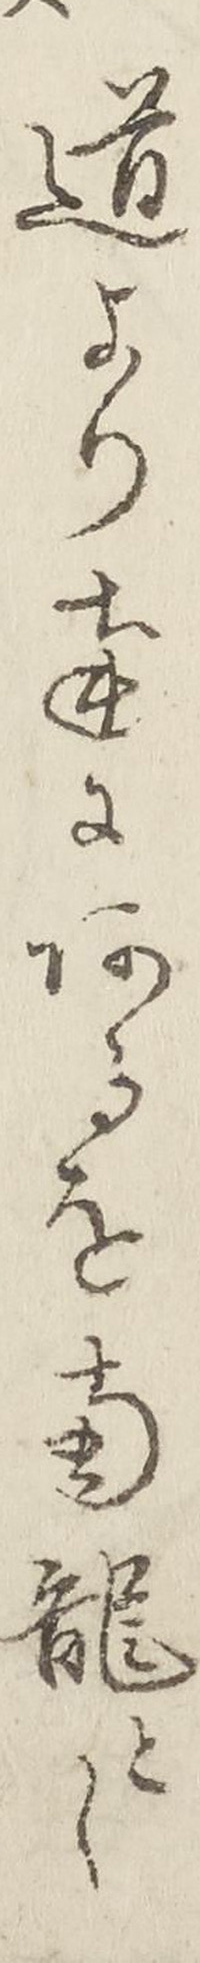道より南にあるを南龍とし
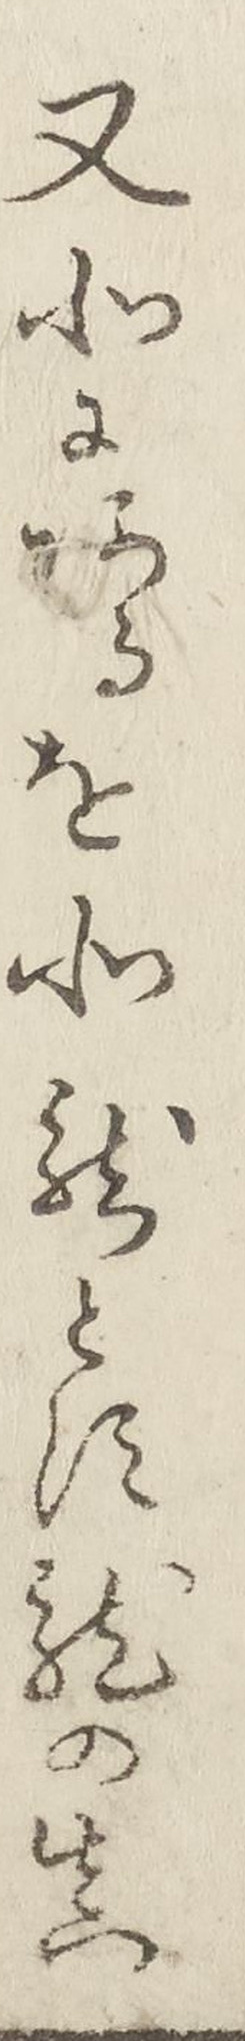又北にあるを北龍とす龍の真
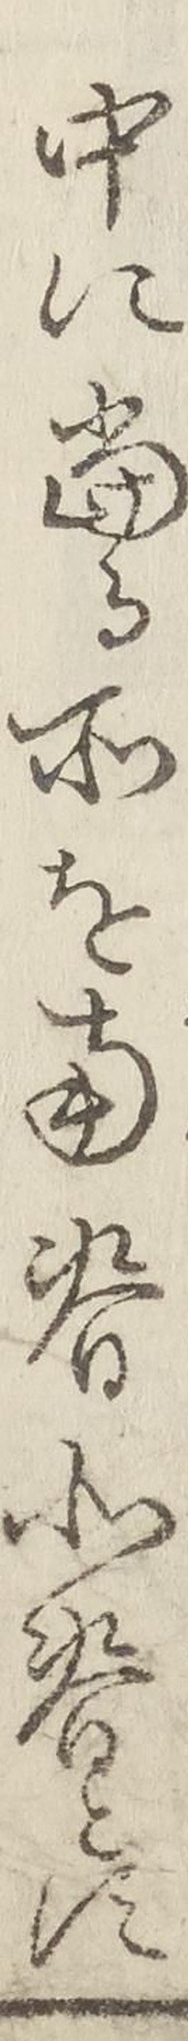中に当る所を南背北背とす
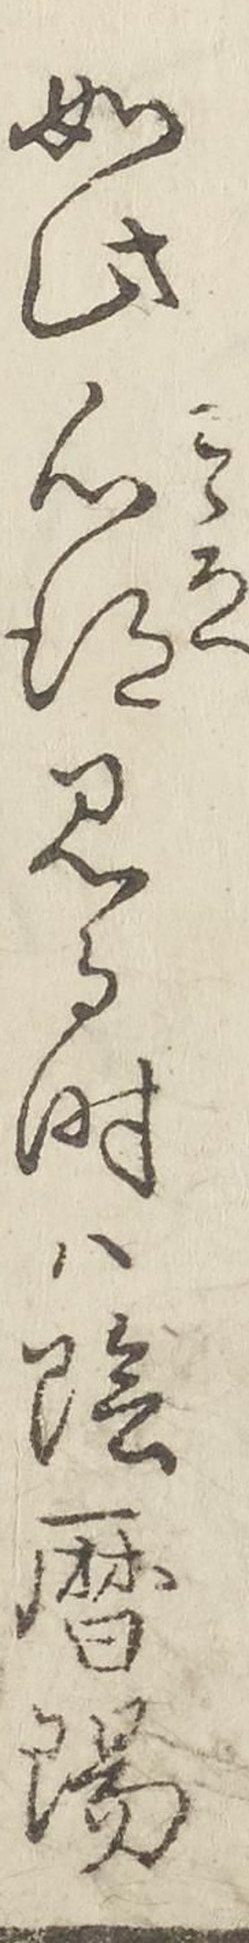如此心得見る時は陰暦陽
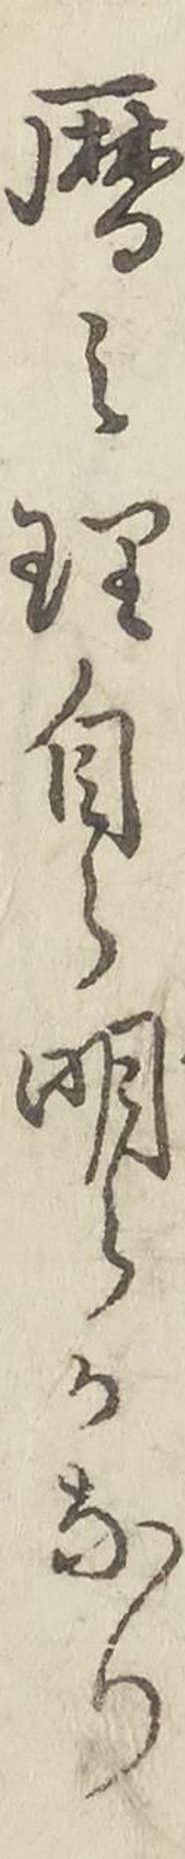暦の理自ら明らかなり

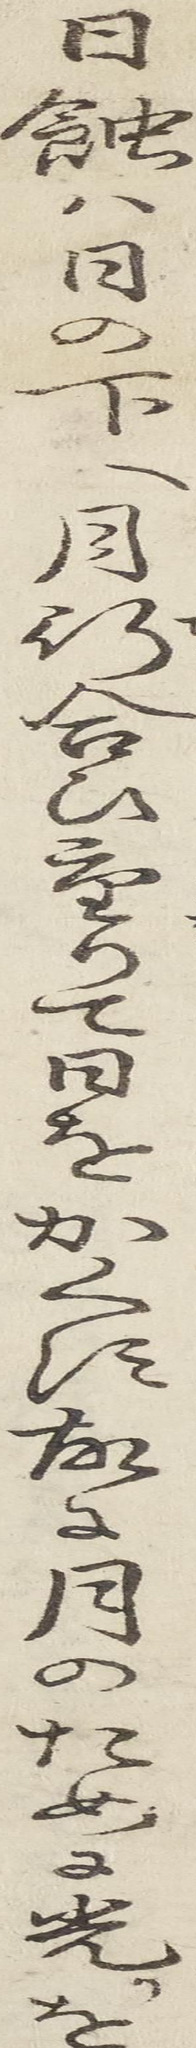日蝕は日の下へ月行合ひ重りて日をかくす故に月のために光リを
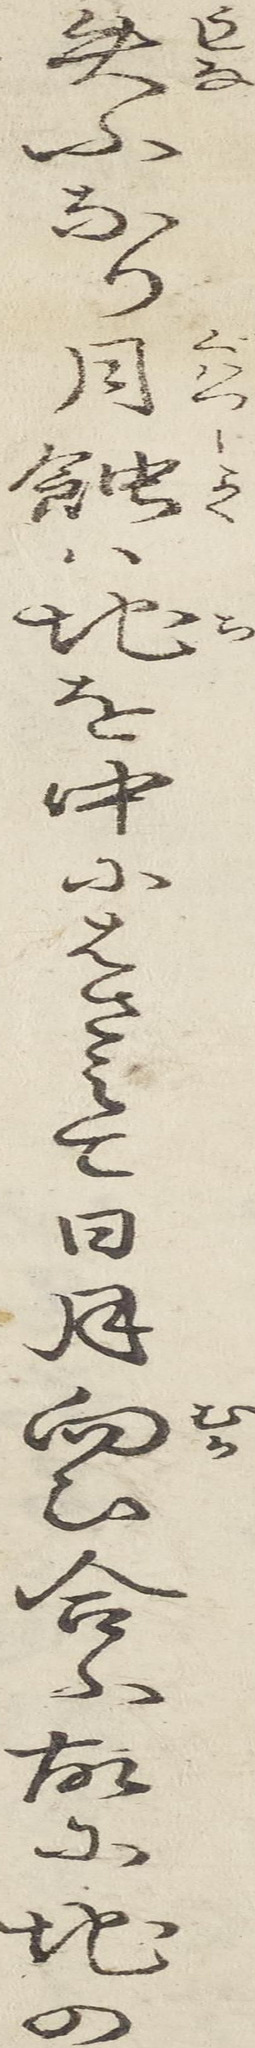失ふなり月蝕は地を中にはさみて日月向ひ合ふ故に地の
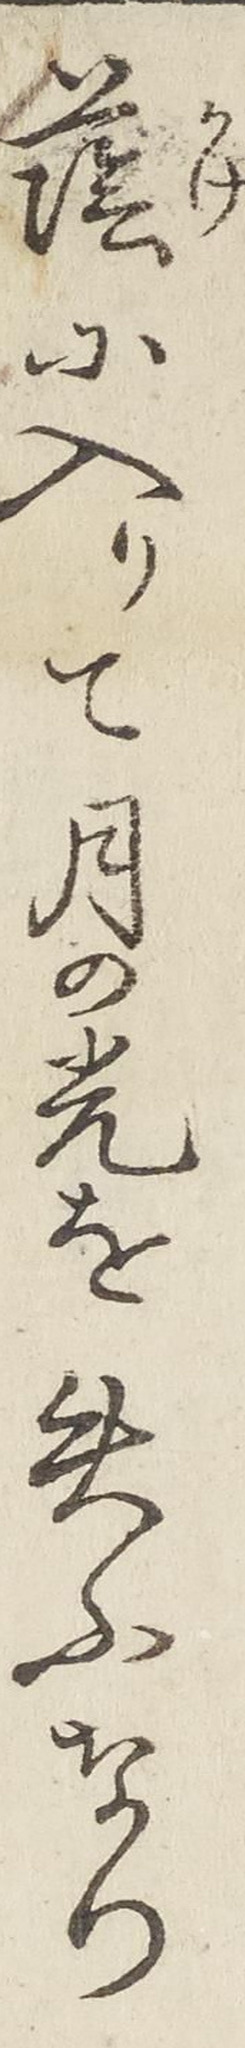蔭に入りて月の光を失ふなり
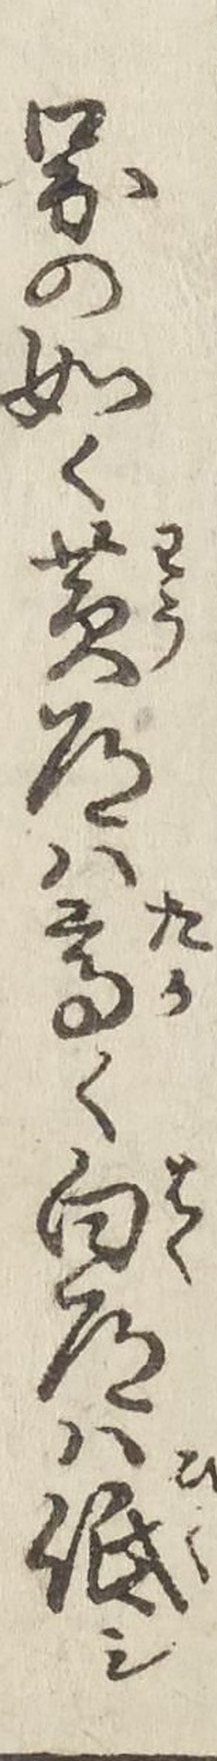図の如く黄道は高く白道は低シ
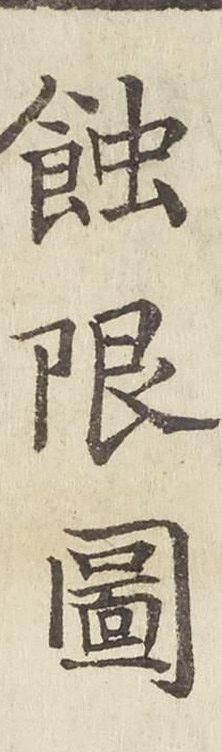蝕限図
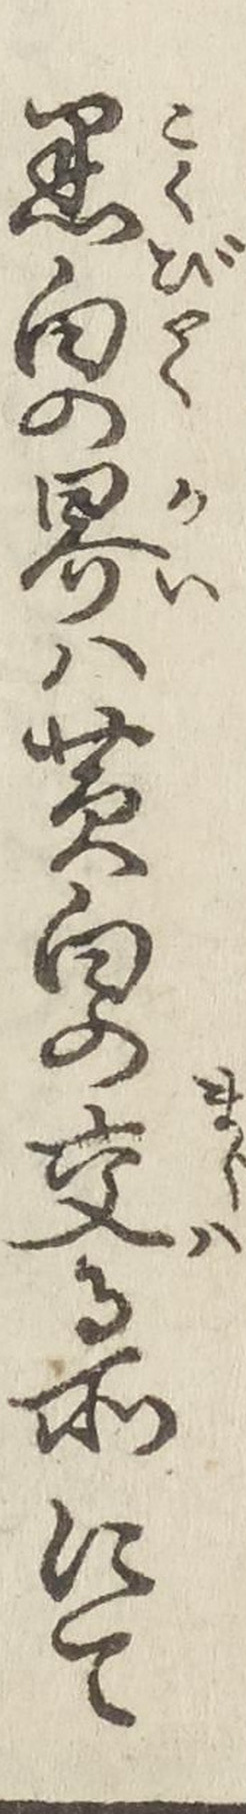黒白の界は黄白の交る所にて
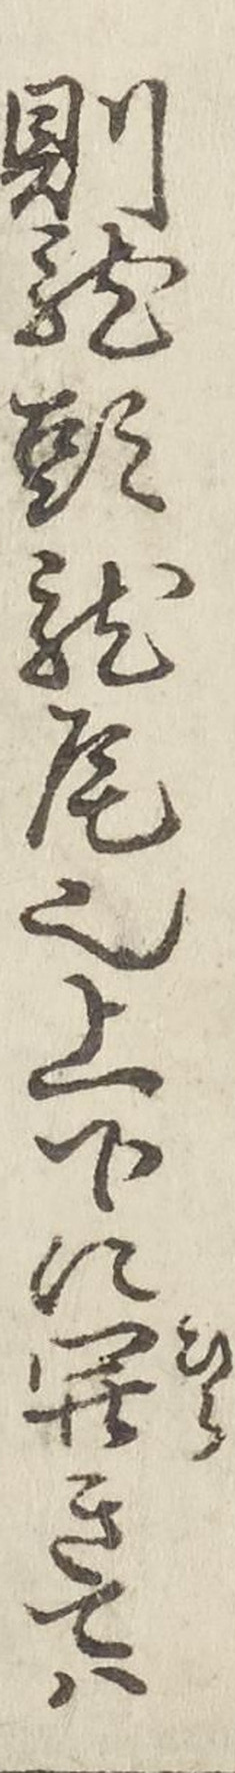則龍頭龍尾也上下に開きては
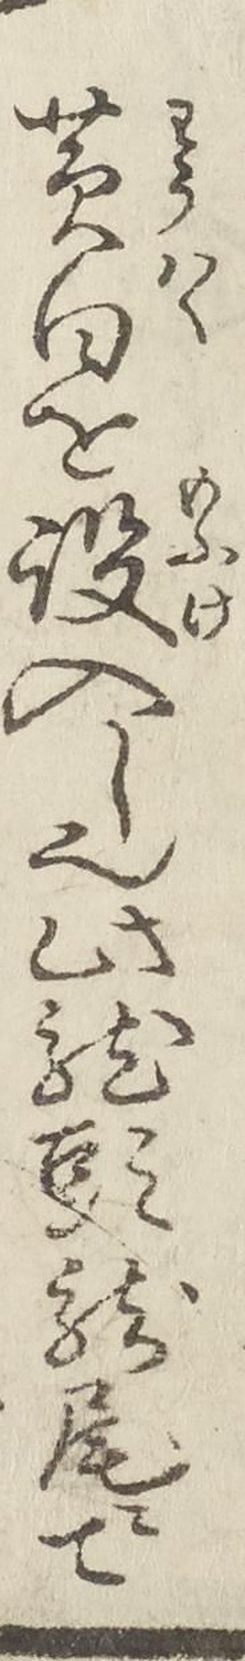黄白を設入し也龍頭龍尾ニて
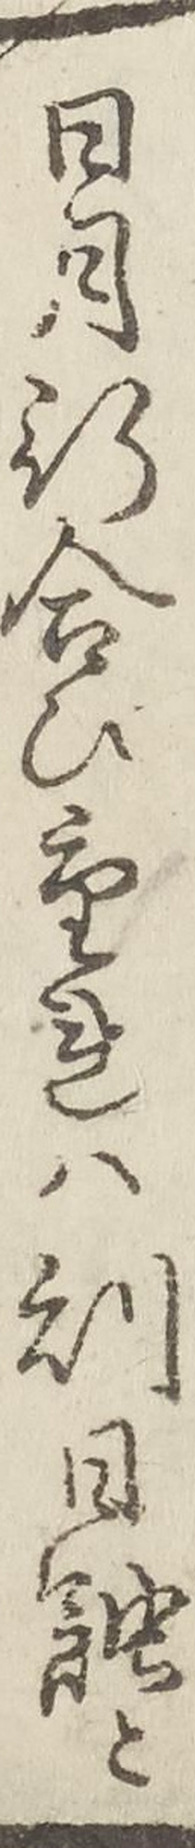日月行合ひ重れは則日蝕と
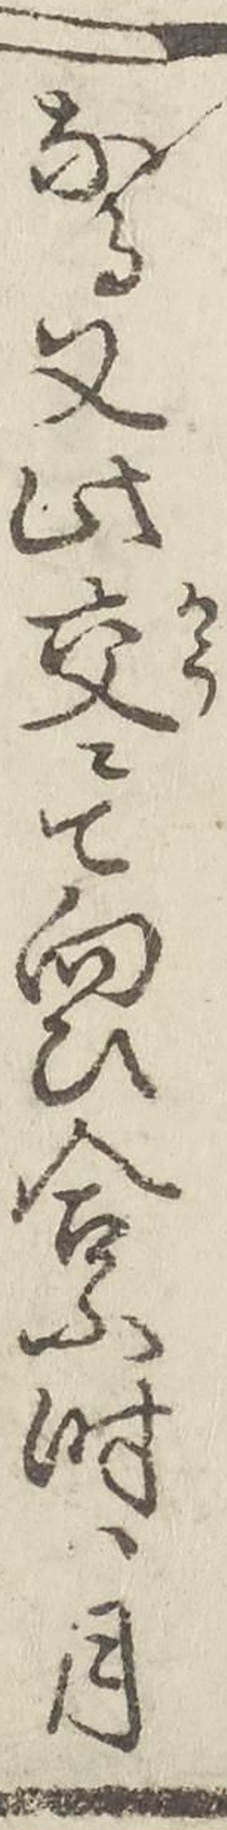なる又此交ニて向ひ合ふ時々月
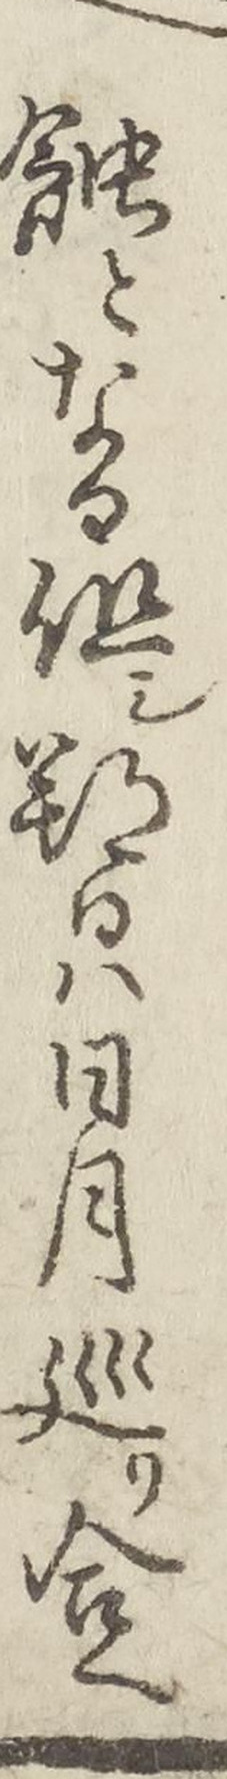蝕となる但シ朔日は日月巡リ合へ
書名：平天儀圖解
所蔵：東京大学地震研究所図書室 Earthquake Research Institute Library, The University of Tokyo, JAPAN
